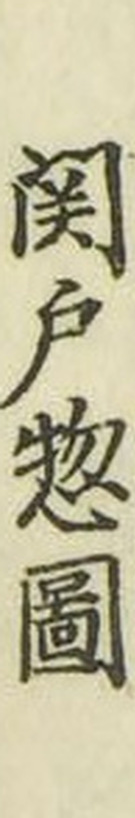関戸惣図
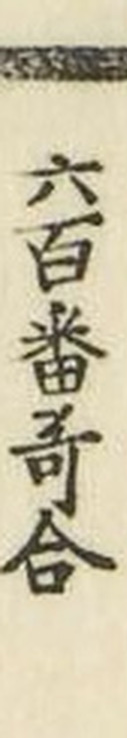六百番哥合
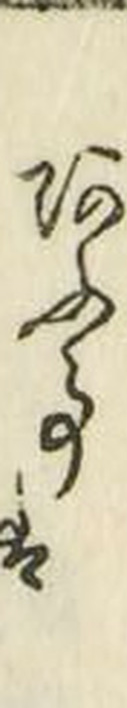あふ事は
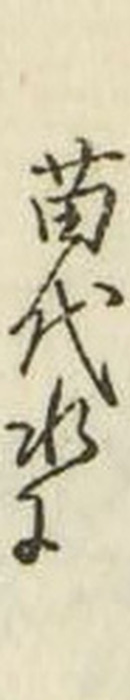苗代水に
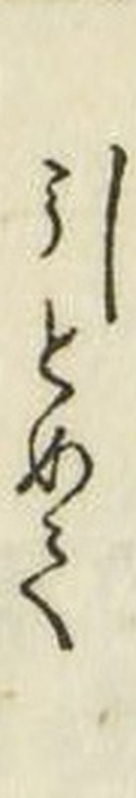引とめて
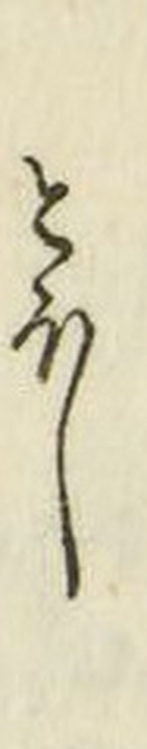とほし
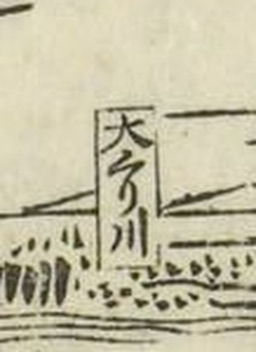大くり川
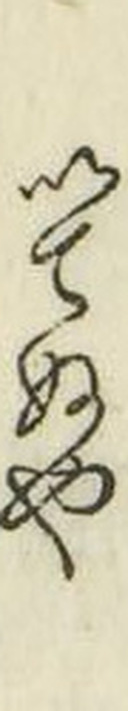いてぬや
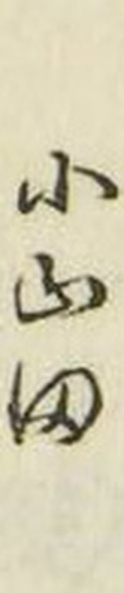小山田

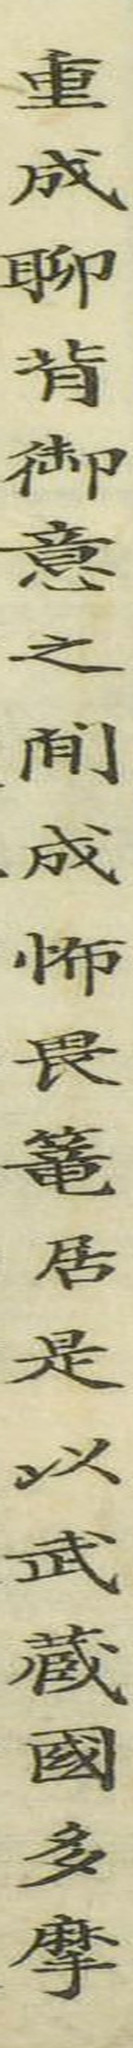重成聊背御意之聞成怖畏篭居是以武蔵国多摩
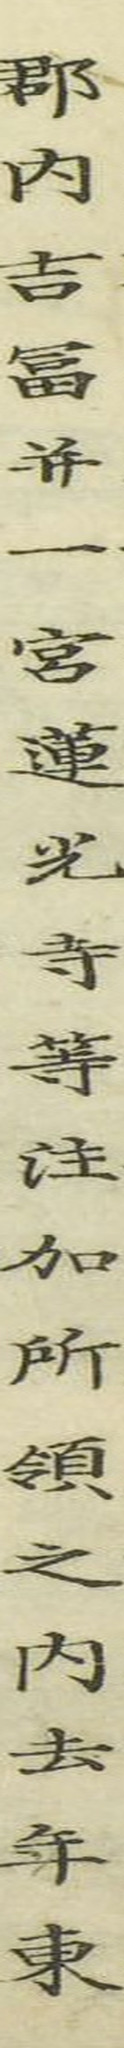郡内吉富并一宮蓮光寺等註加所領之内去年東
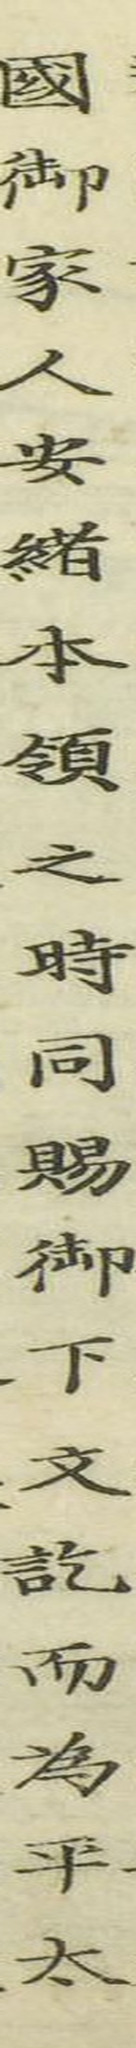国御家人安緒本領之時同賜御下文訖而為平太
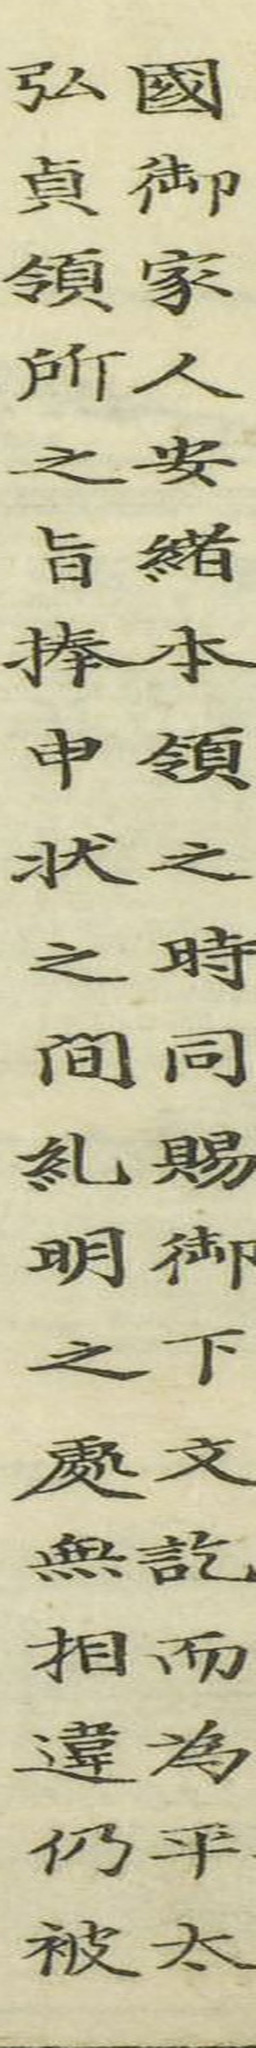弘貞領所之旨捧申状之間糺明之處無相違仍被
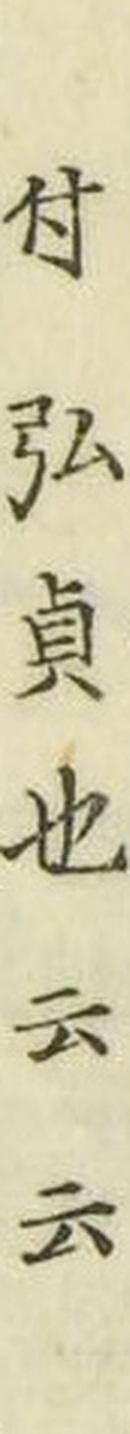付弘貞也云云
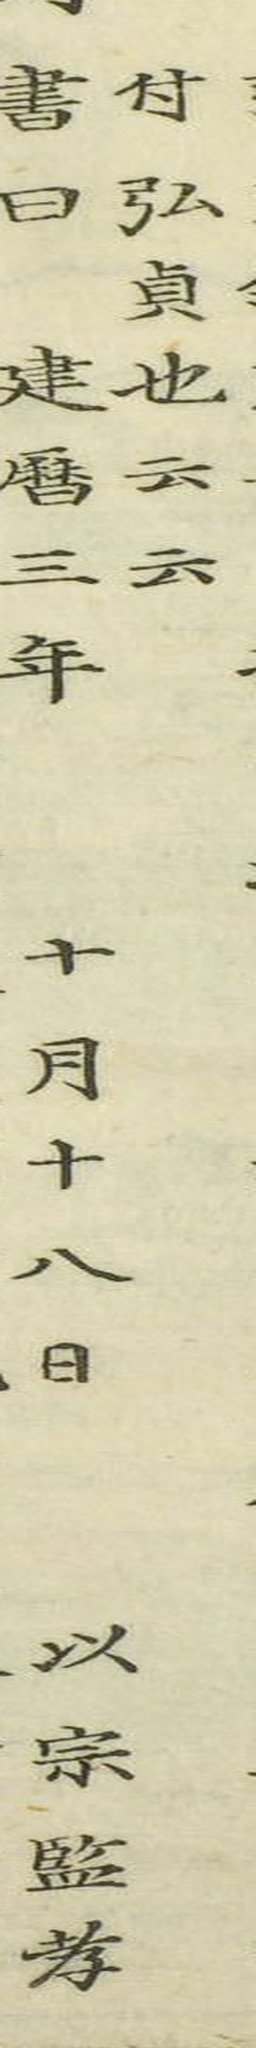同書曰建暦三年十月十八日以宗監孝
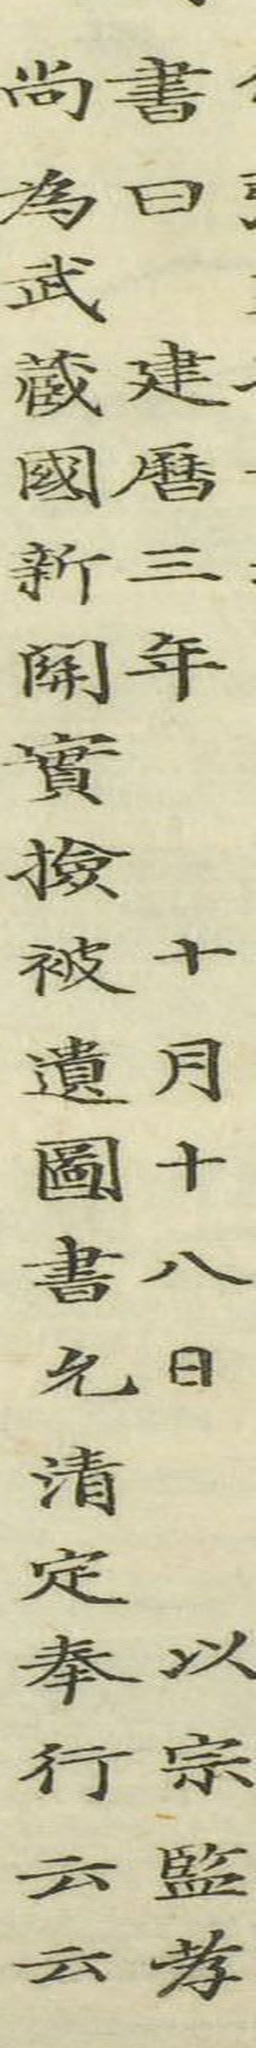尚為武蔵国新関実撿被遺図書允清定奉行云云
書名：江戸名所図会 20巻 巻之10
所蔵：東京学芸大学教育コンテンツアーカイブ
